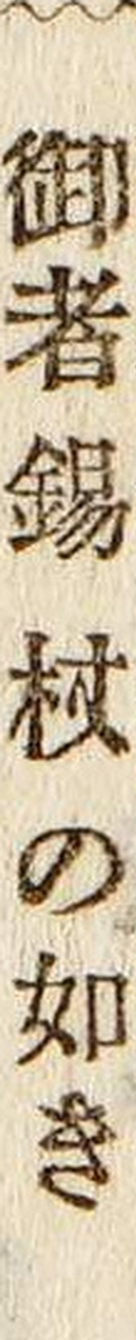御者錫杖の如き
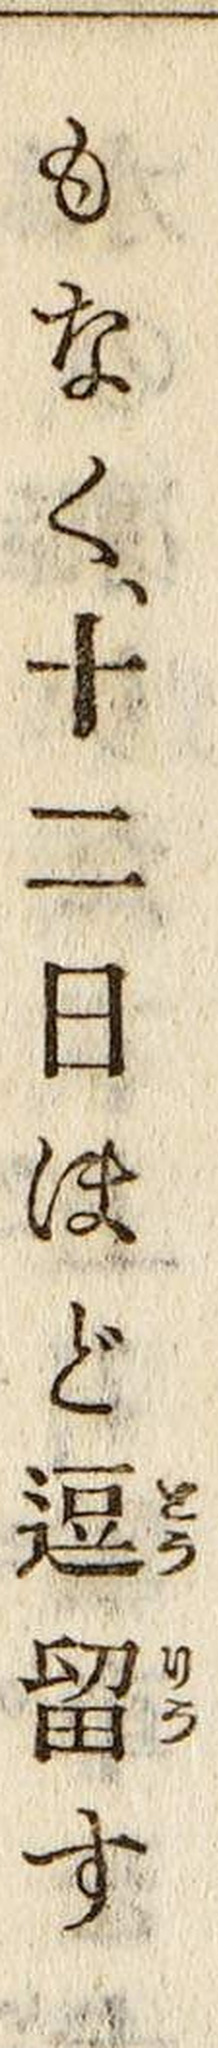もなく、十二日ほど逗留す
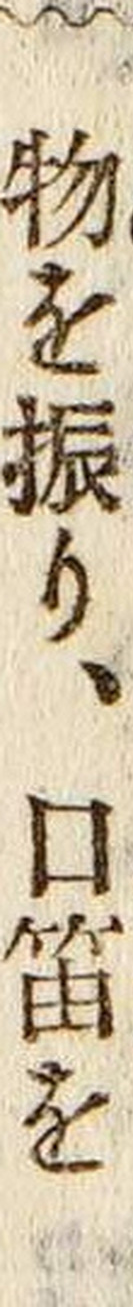物を振り、口笛を
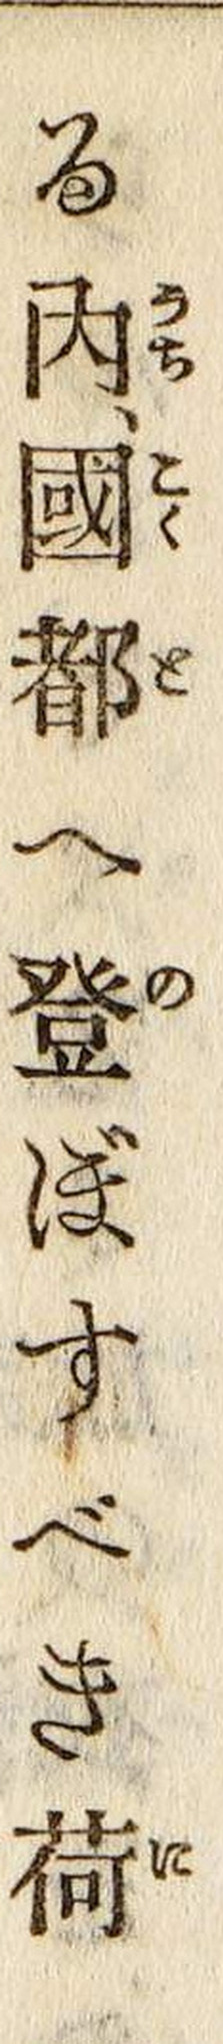る内国都へ登ぼすべき荷
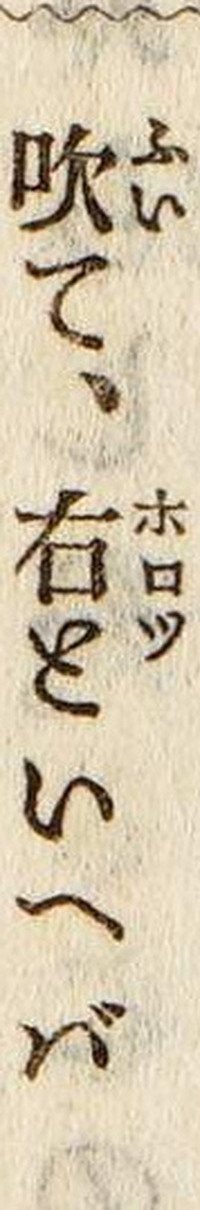吹て、右といへバ
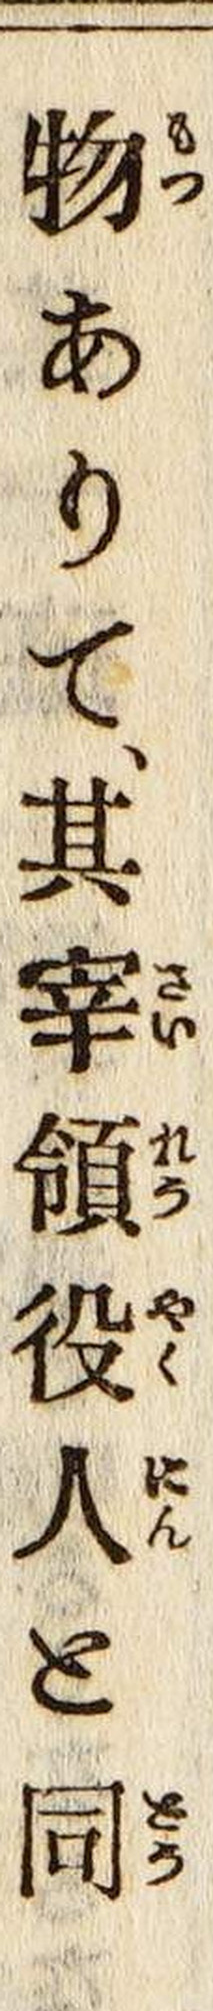物ありて、其宰領役人と同
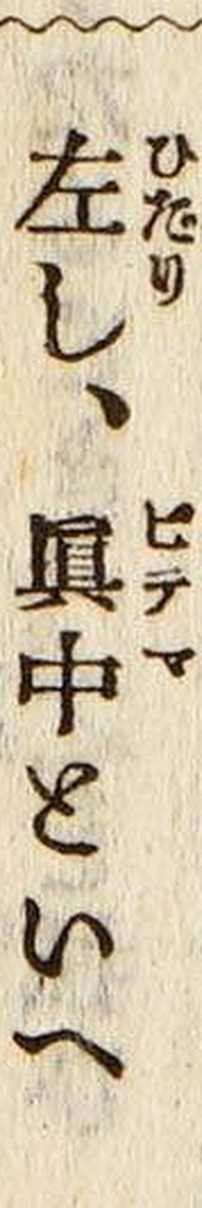左し、真中といへ
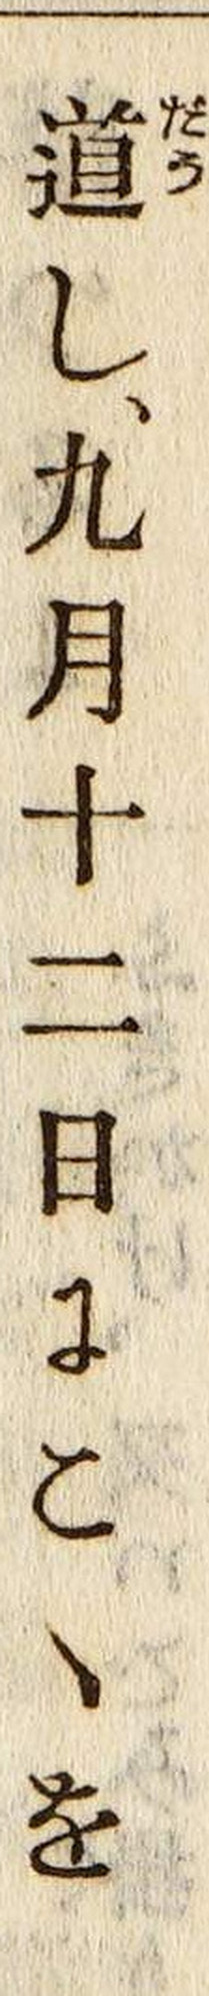道し、九月十二日にこゝを
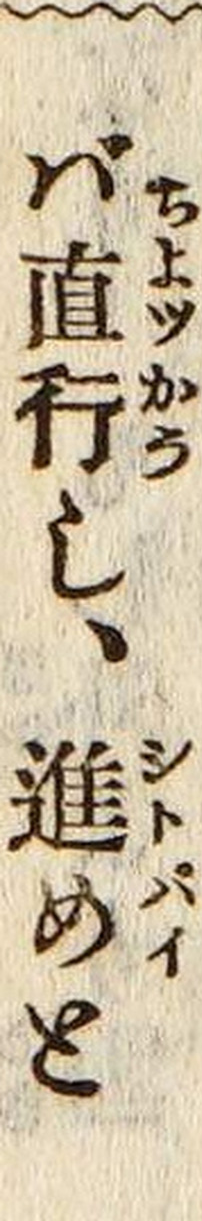バ直行し、進めと
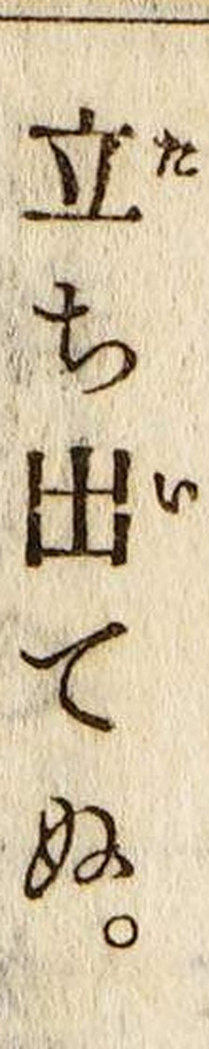立ち出てぬ。
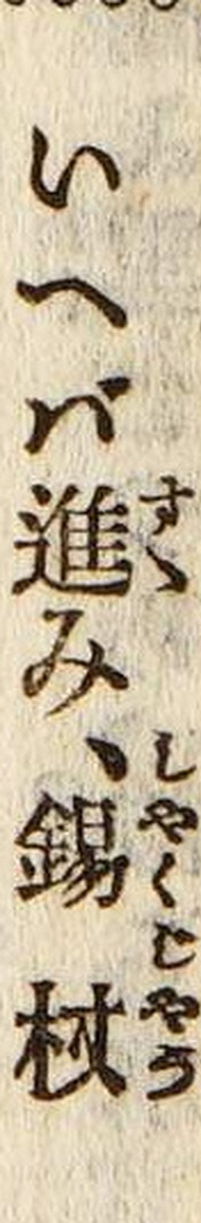いへバ進み、錫杖
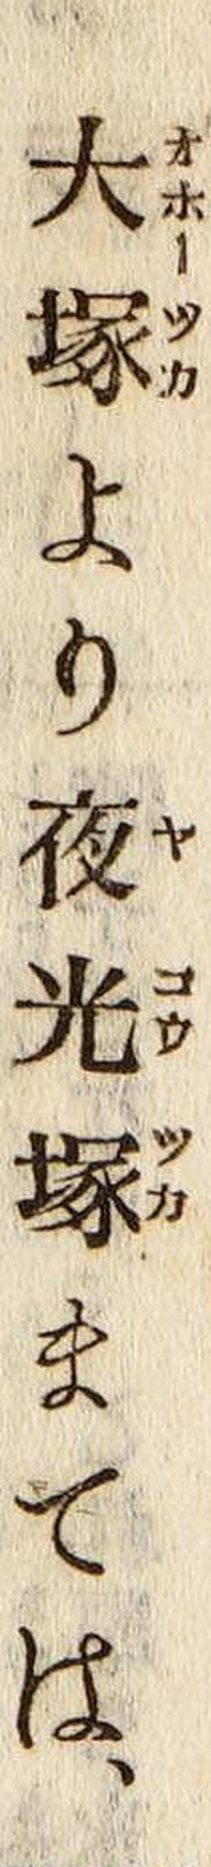大塚より夜光塚まては、
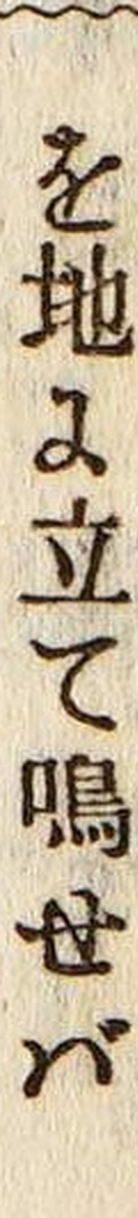を地に立て鳴せバ
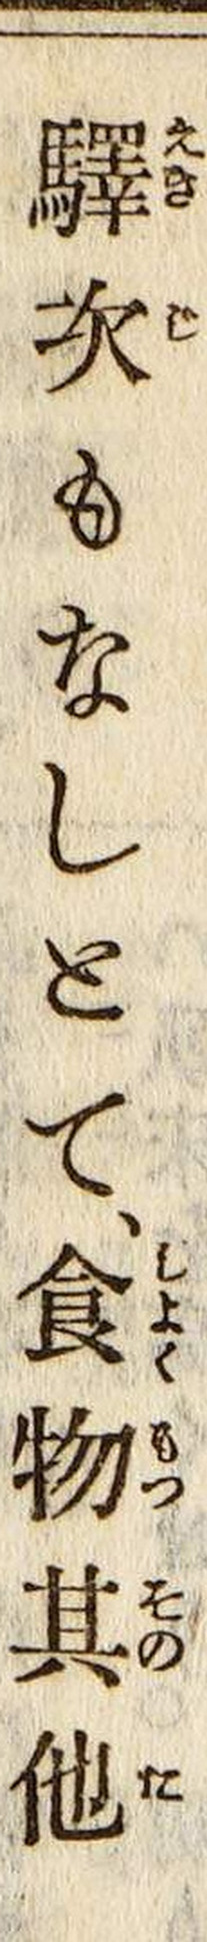駅次もなしとて、食物其他
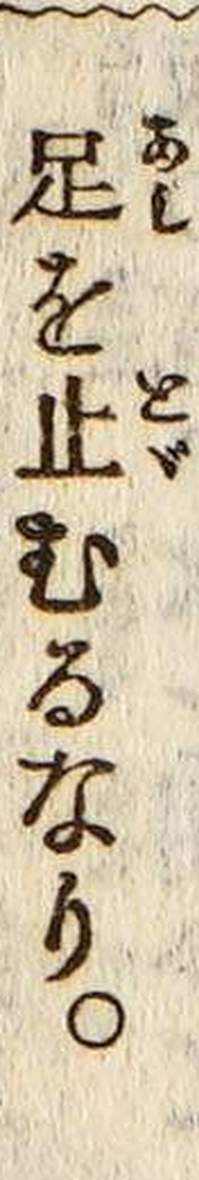足を止ムルなり。
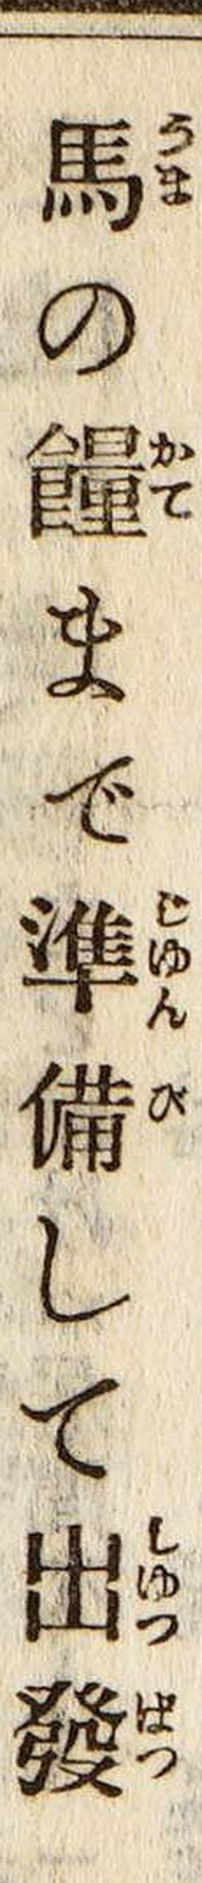馬の糧まで準備して出発
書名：日本漂流譚
